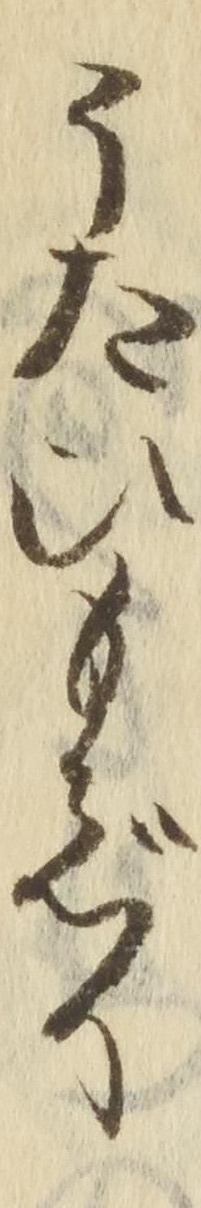うたいもぢり
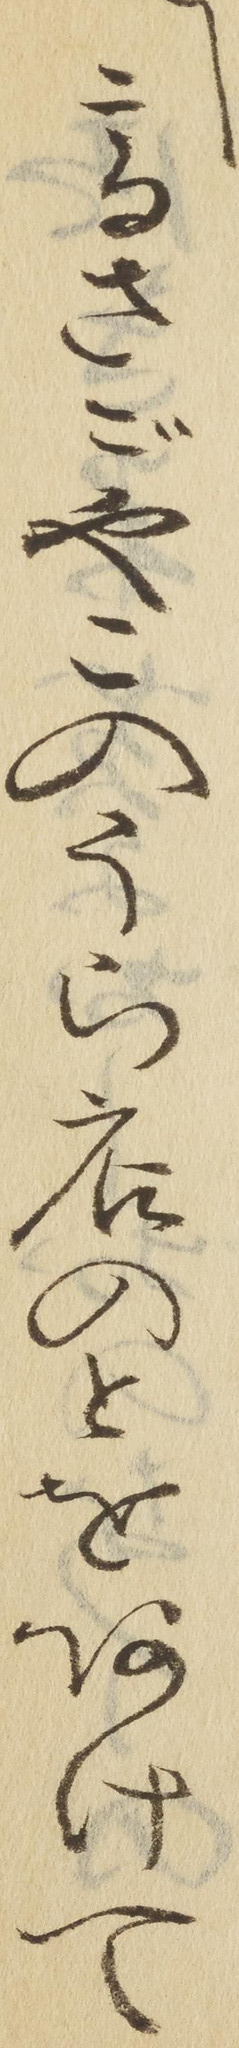「高さごやこのうら店のとをあけて

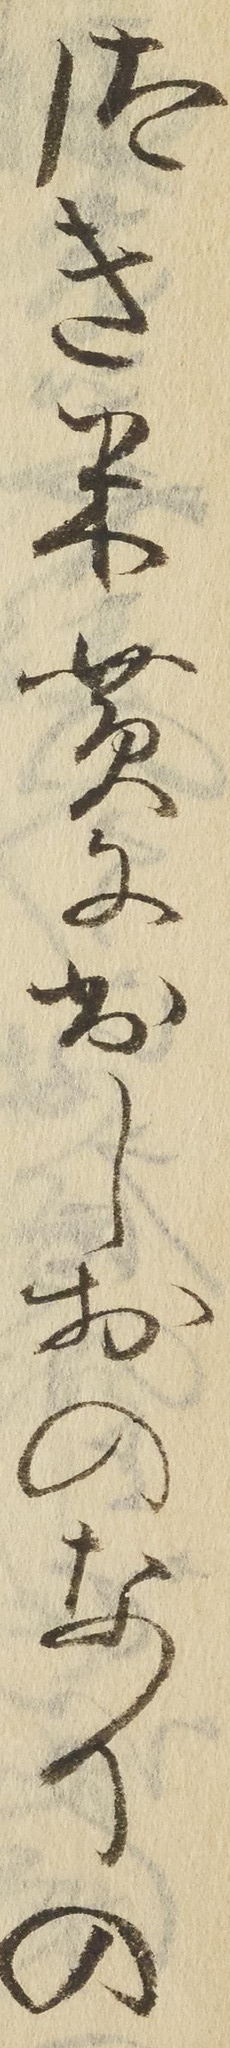つき米貰に出しおのなりの
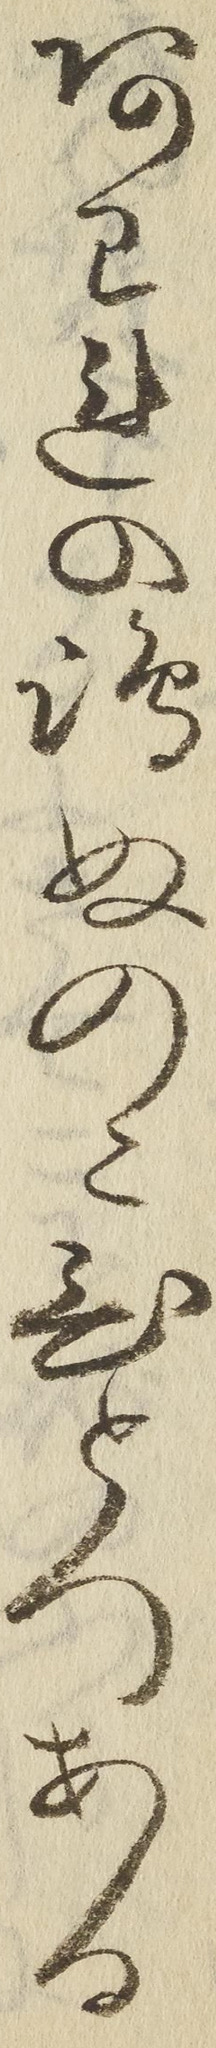あわれの嶋ぬのとひとりある
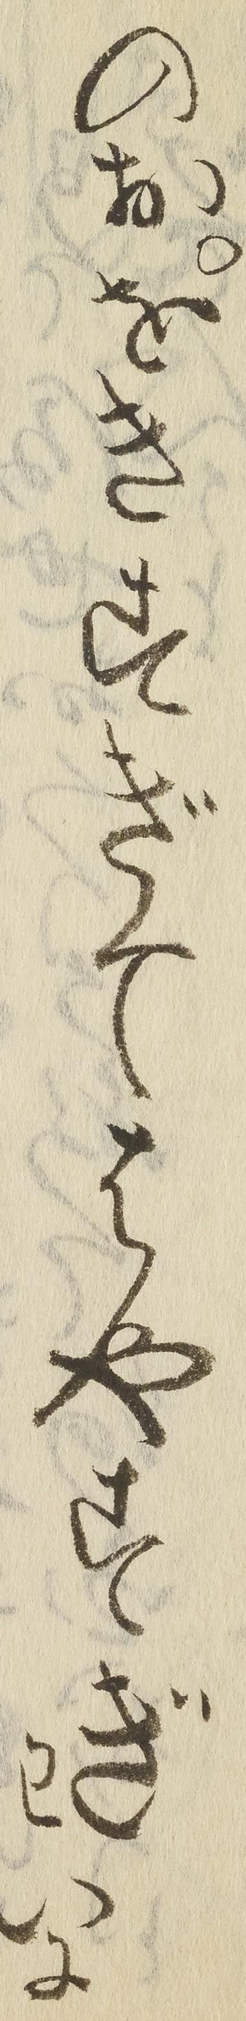のおをきすぎてはやすぎわいに
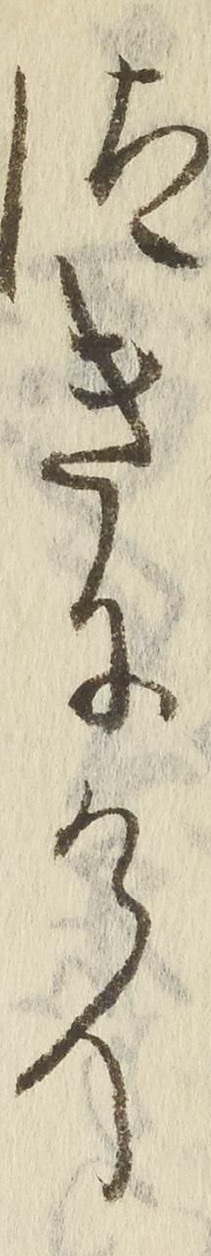すきにかり
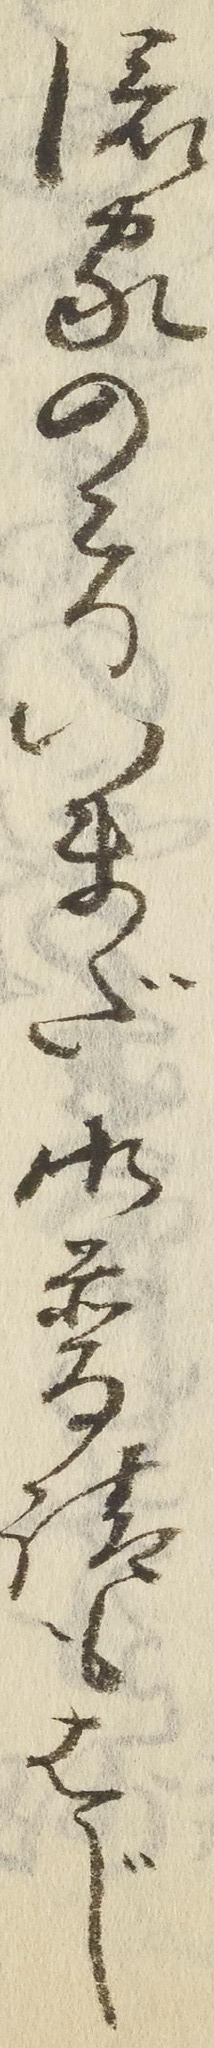流家のこりいまだ御普請もはじ
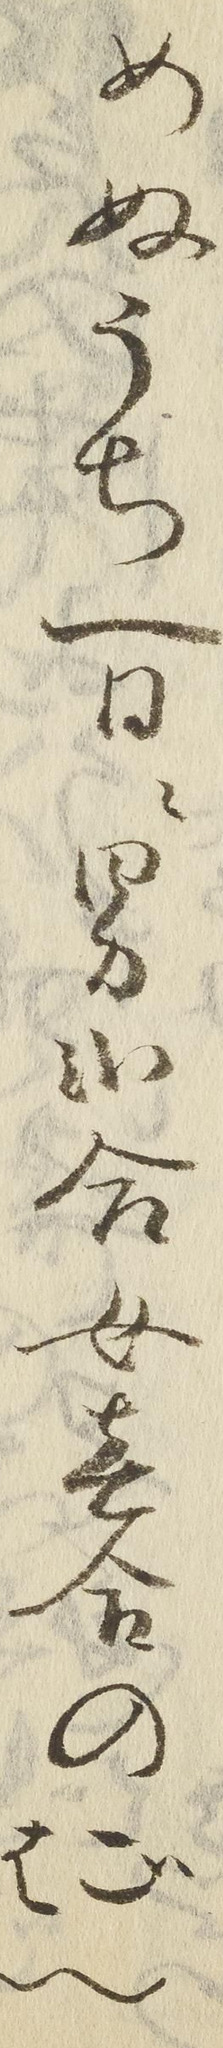めぬうち一日二男弐合女壱合のごはん
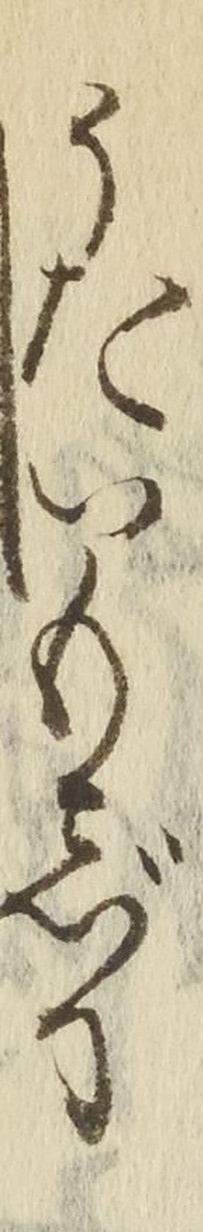うたいもぢる
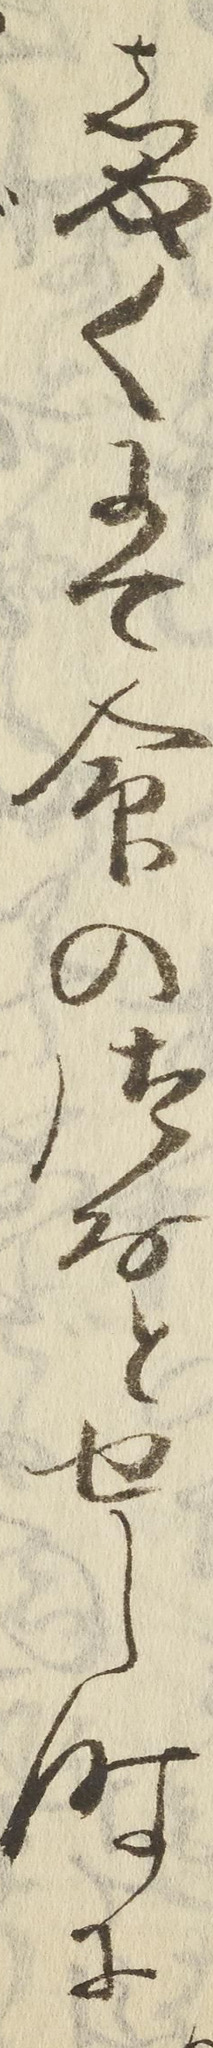しやくにて命のつなとせし時に
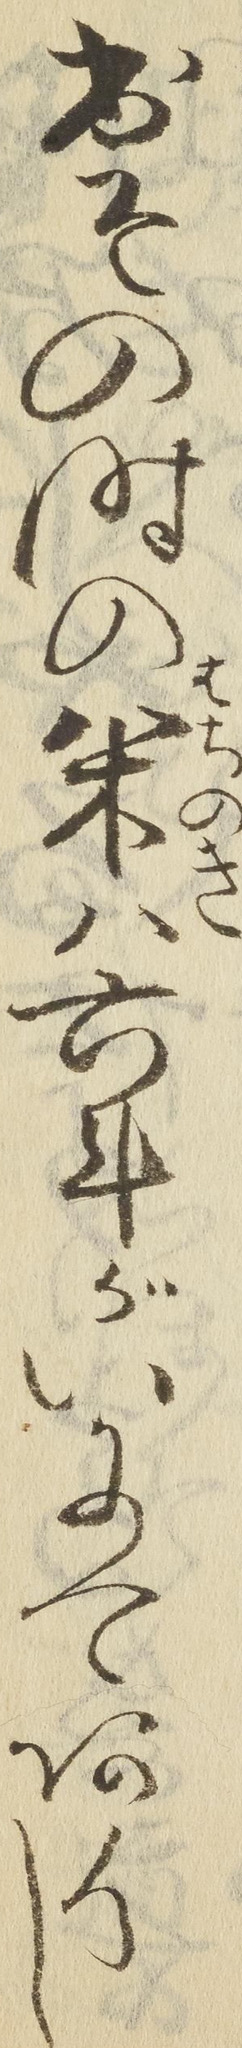「出その時の米は六斗がいにてありし
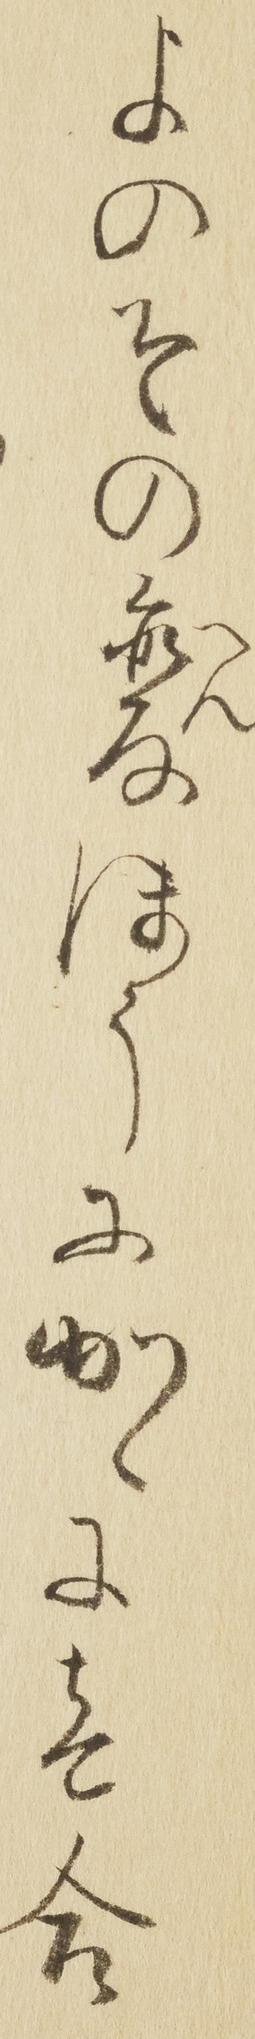よのその変ほうにかゝに壱合
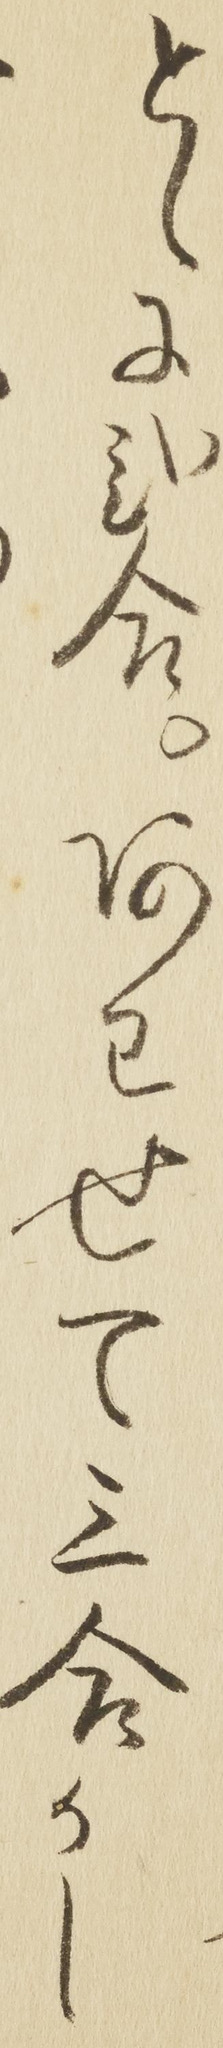としに弐合あわせて三合かし
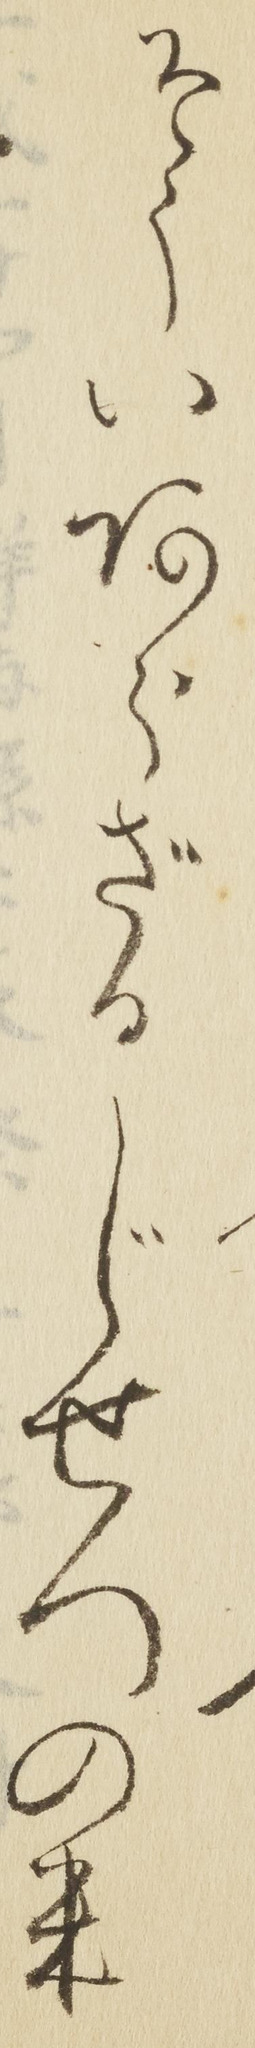ていあらざるじせつの米
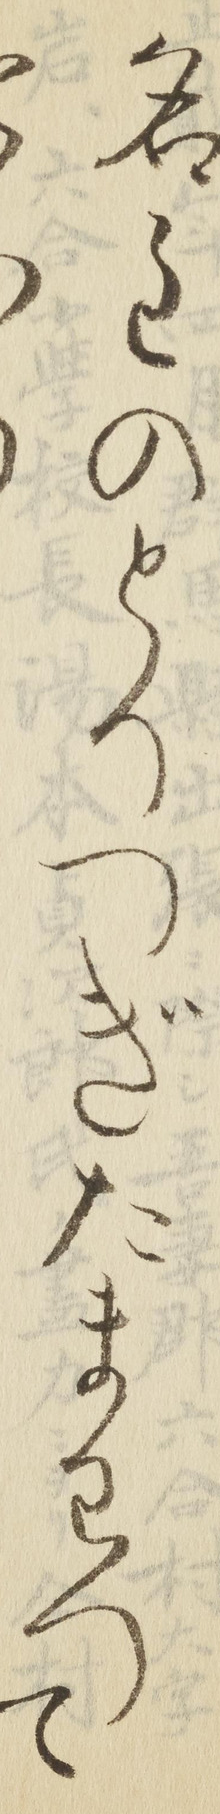名主のとりつぎたまわつて
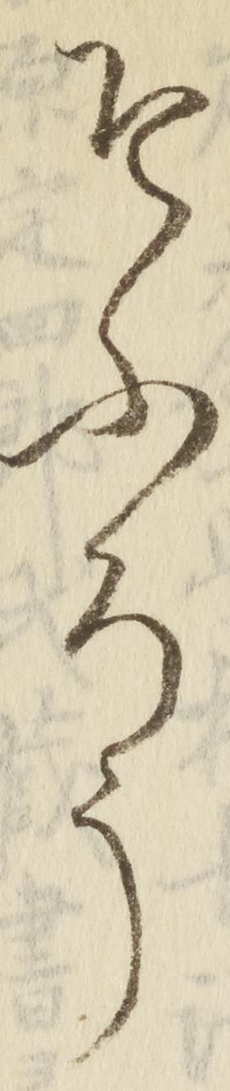そふろう
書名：浅間大變記
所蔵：東京大学地震研究所図書室 Earthquake Research Institute Library, The University of Tokyo, JAPAN
